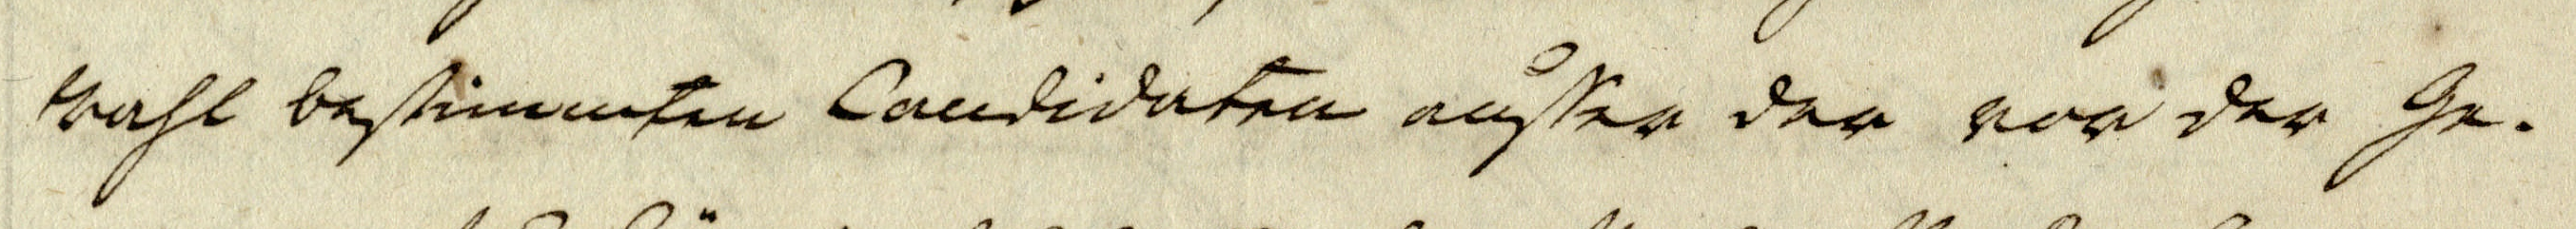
Wahl bestimmten Candidaten ausser der vor der Ge¬
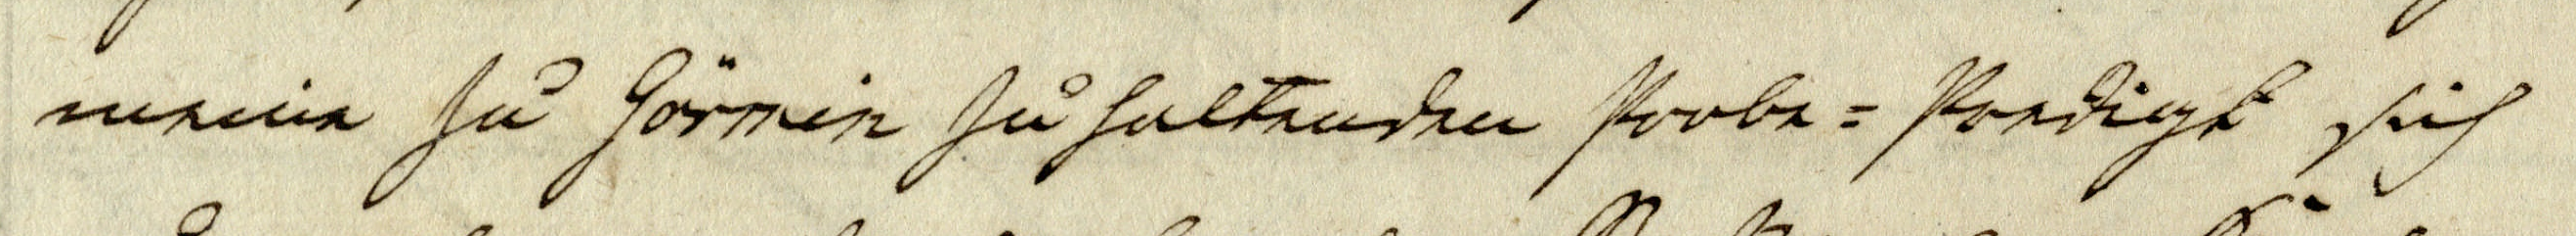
meine zu Görmin zu haltenden Probe- Predigt sich
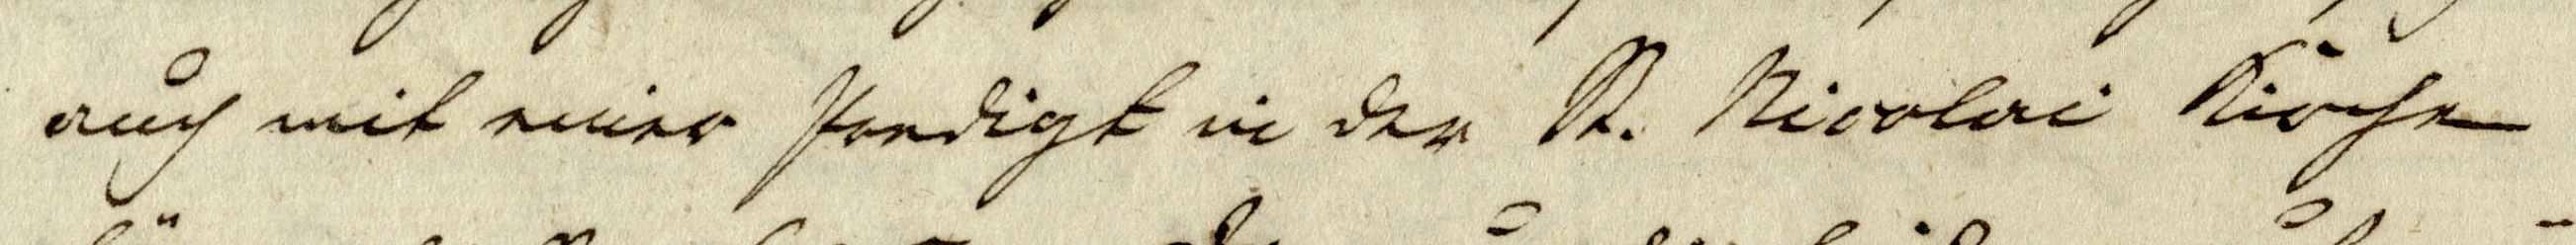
auch mit einer Predigt in der Sr. Nicolai Kirchen
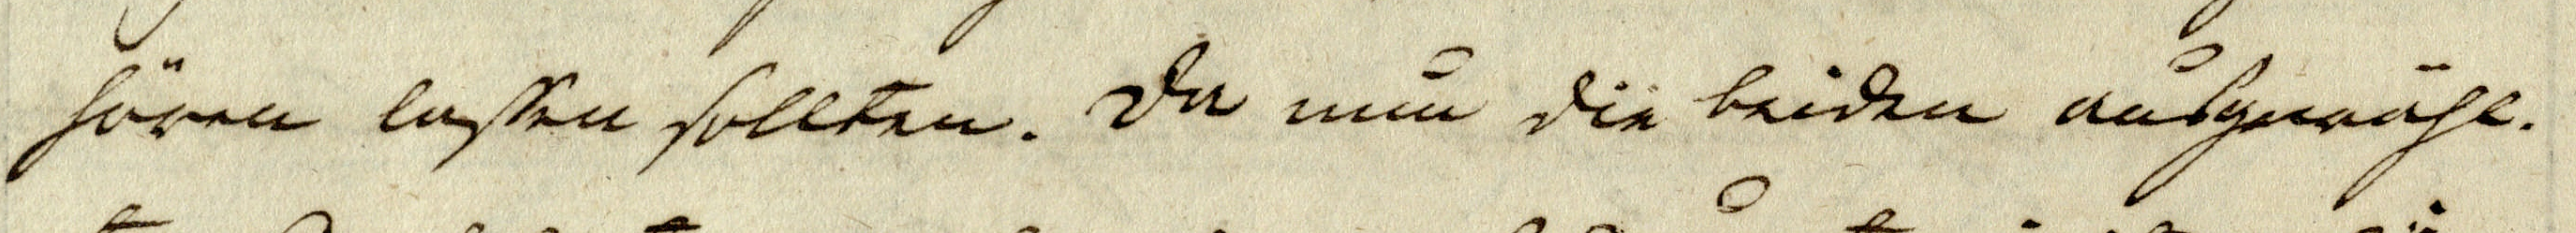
hören lassen sollten. Da nun die beiden ausgewähl¬
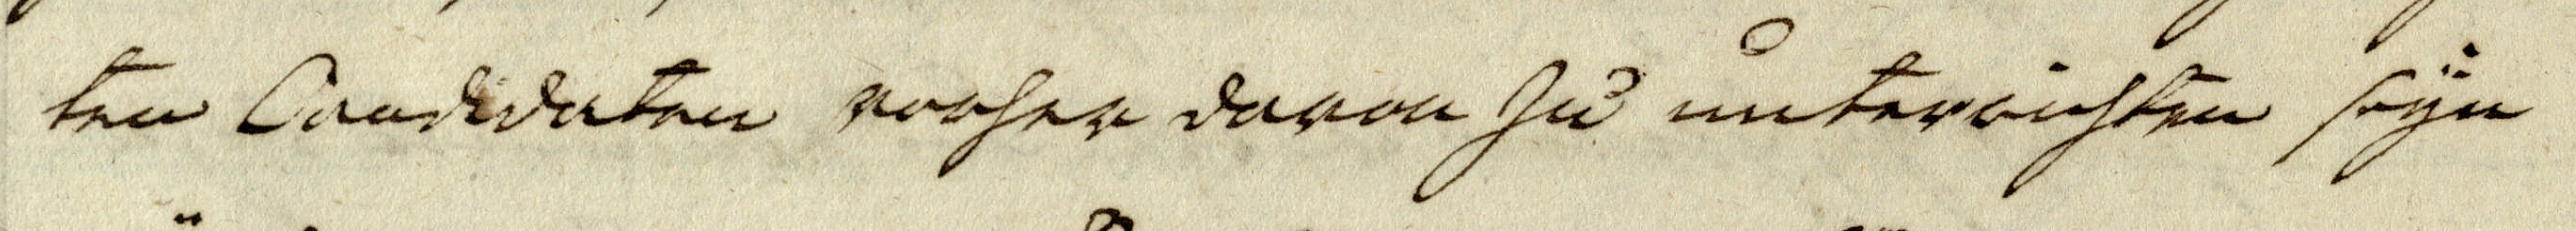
ten Candidaten vorher davon zu unterrichten seÿn
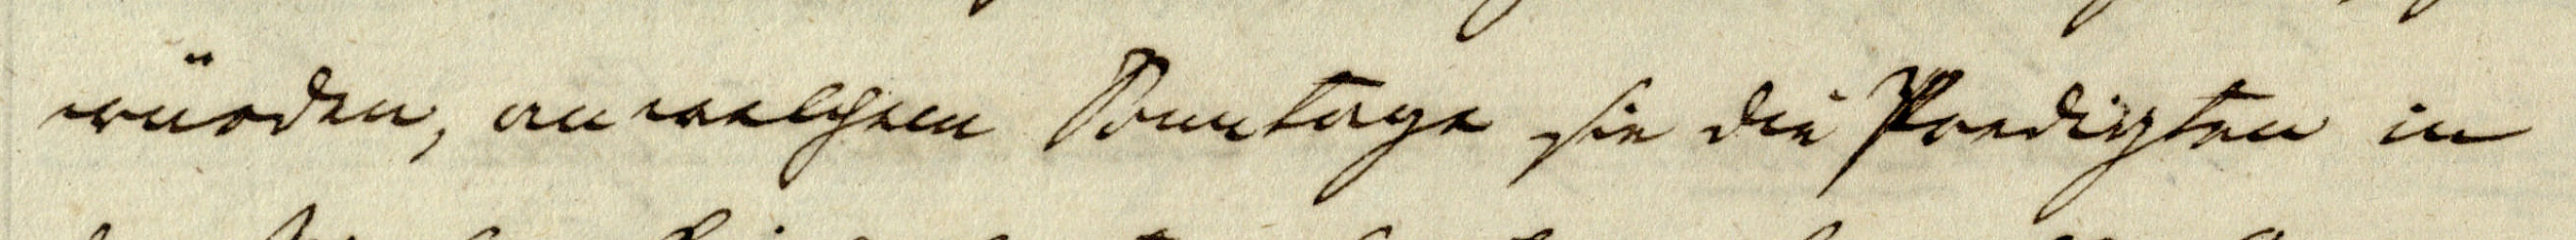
würden, an welchem Sonntage sie die Predigten in
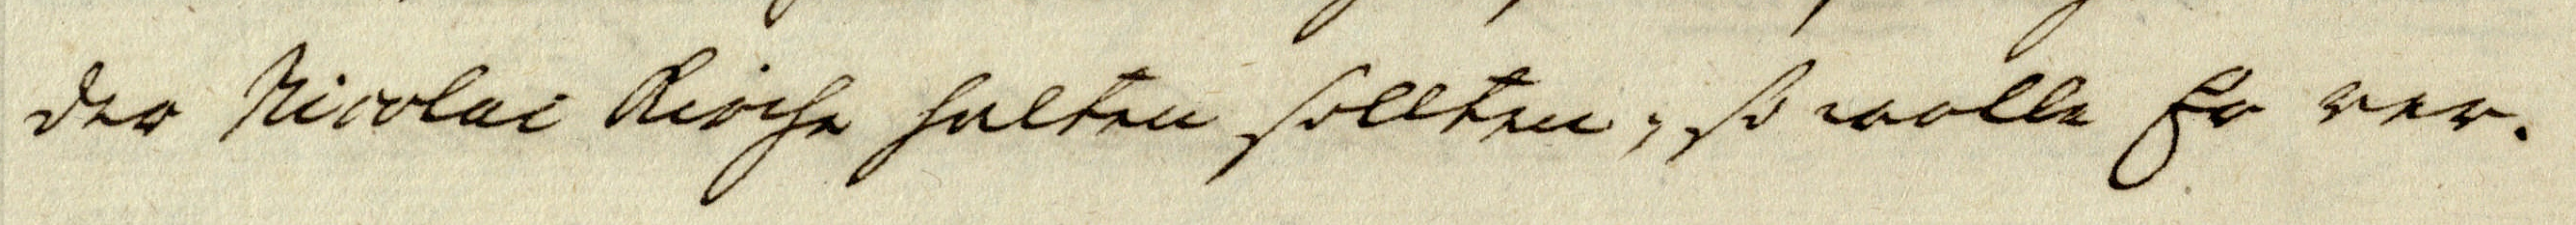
der Nicolai Kirche halten sollten; so wolle Er ver¬
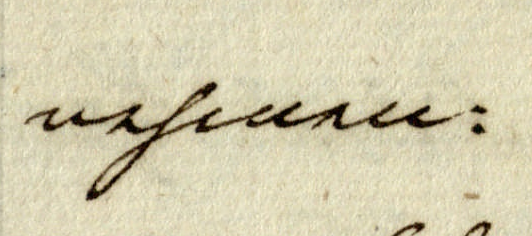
nehmen:
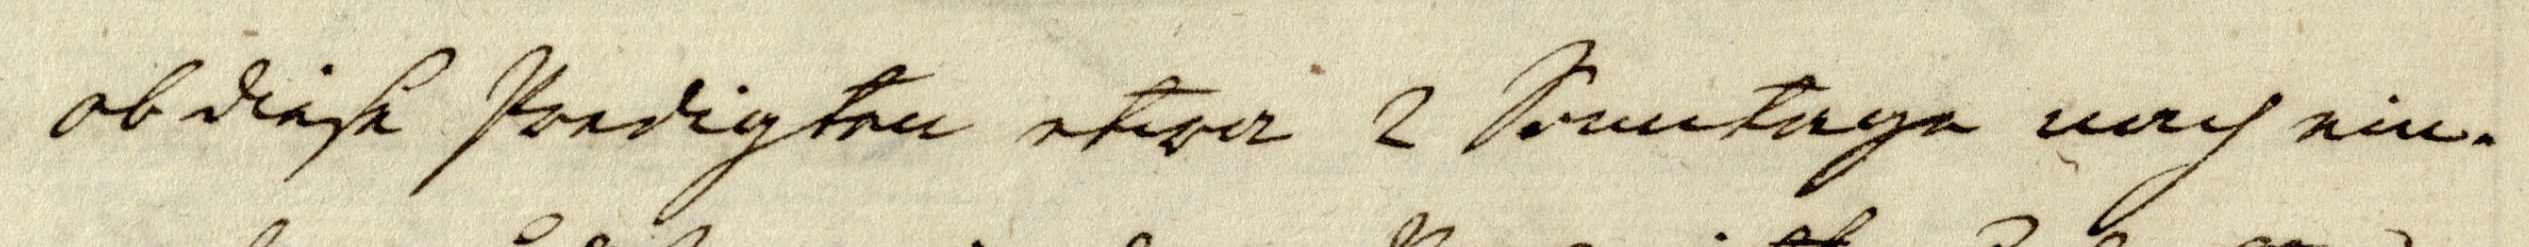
ob diese Predigten etwa 2 Sonntage nach ein¬
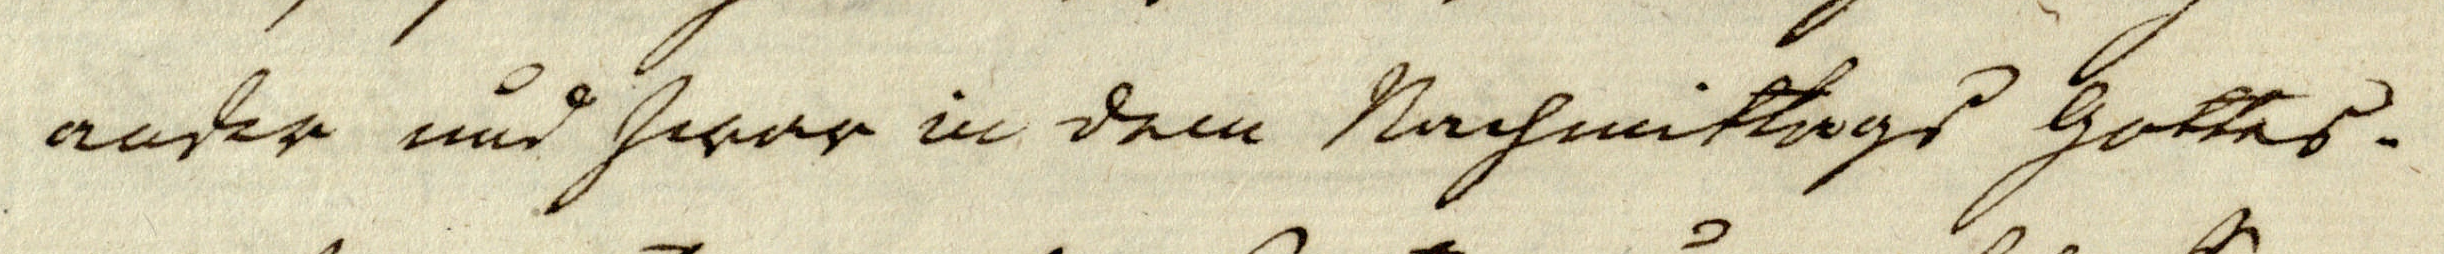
ander und zwar in dem Nachmittags Gottes¬
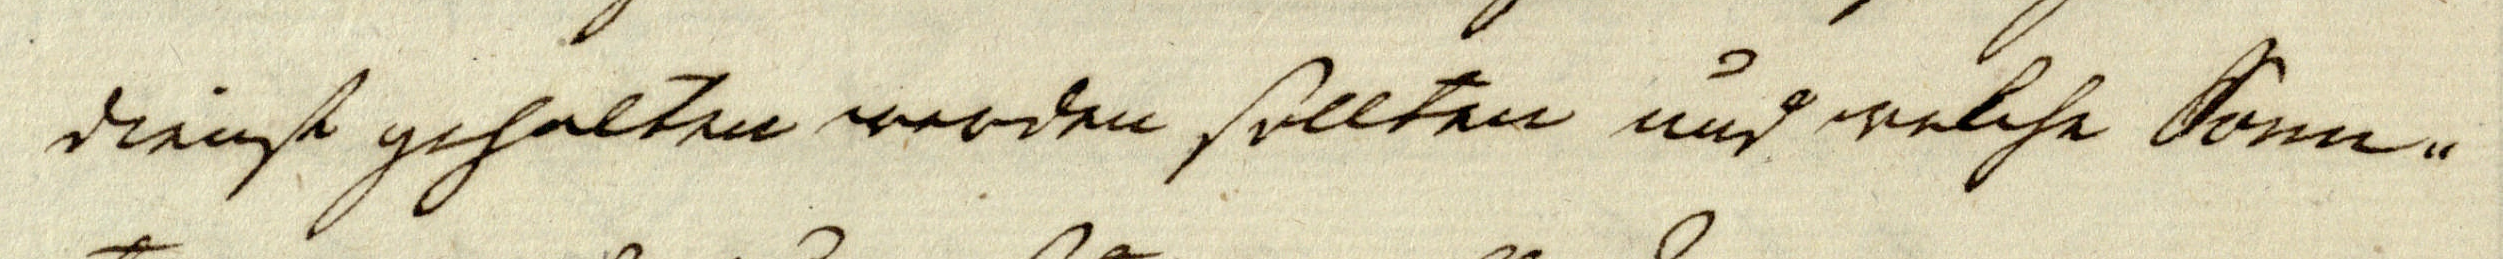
diest gehalten worden sollten und welche Sonn¬
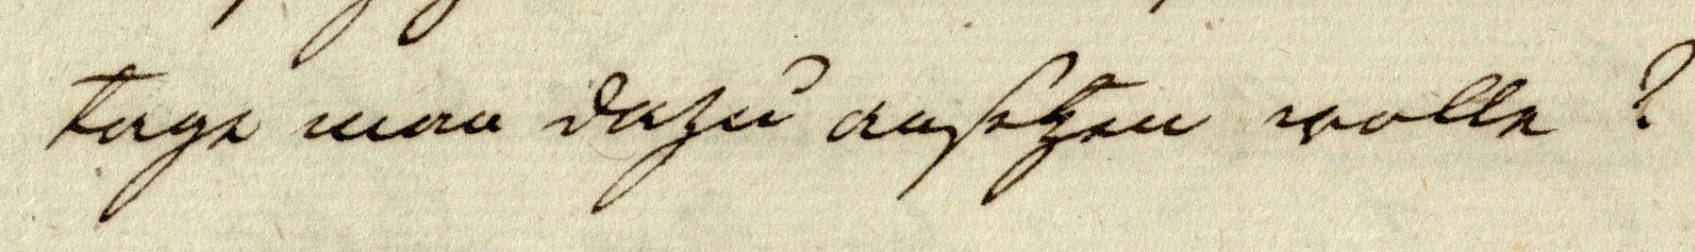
tage man dazu ansetzen wolle ?
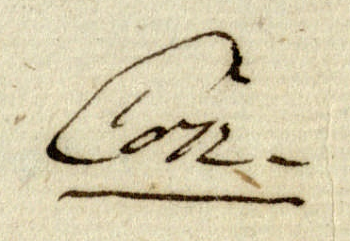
Con
